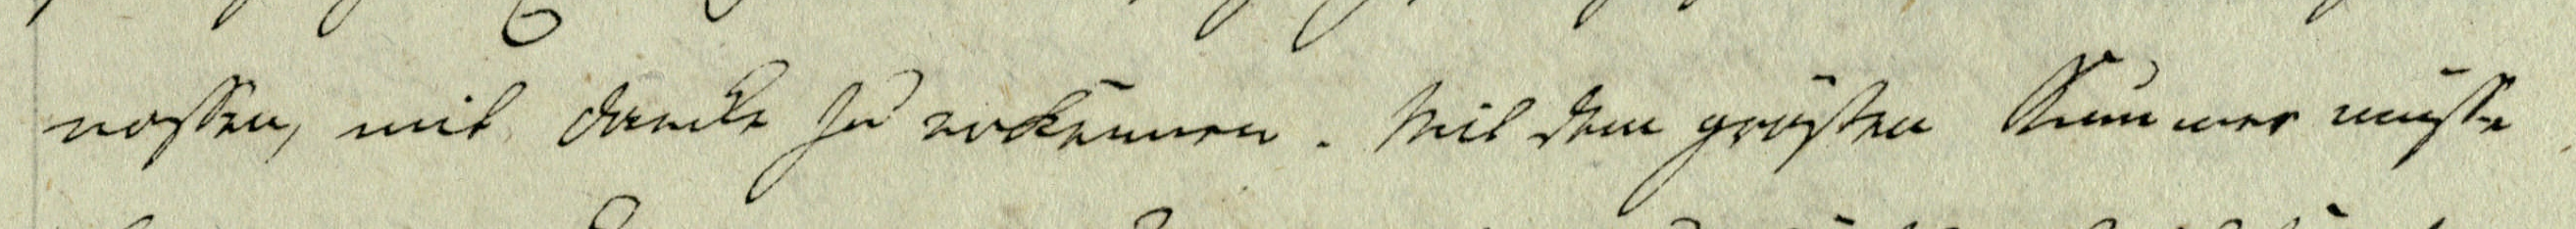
nossen, mit Dancke zu erkennen. Mit dem grösten Kummer müsse
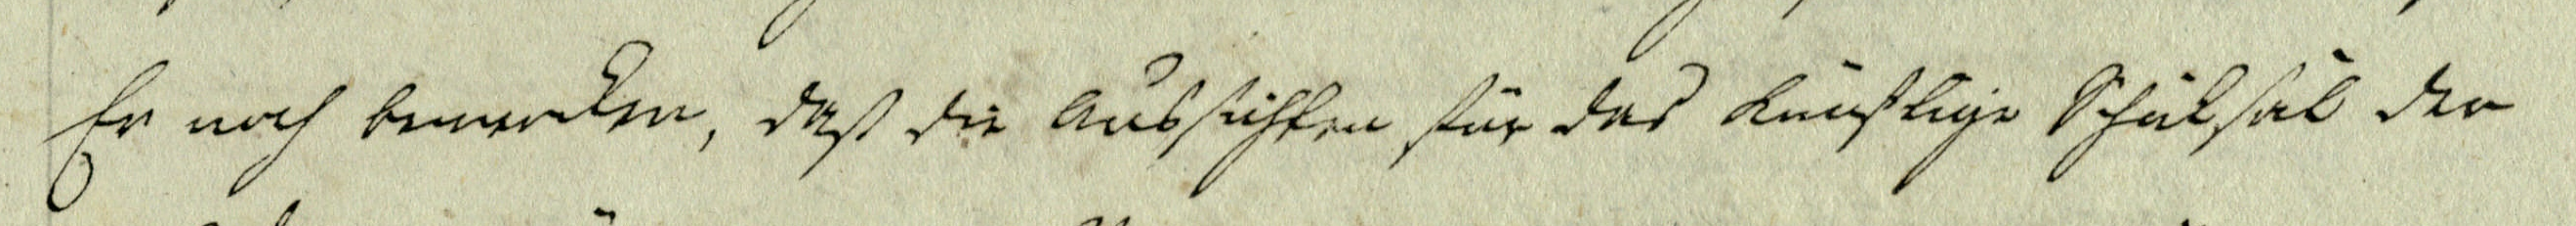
Er noch bemerken, daß die Aussichten für das künftige Schicksal der
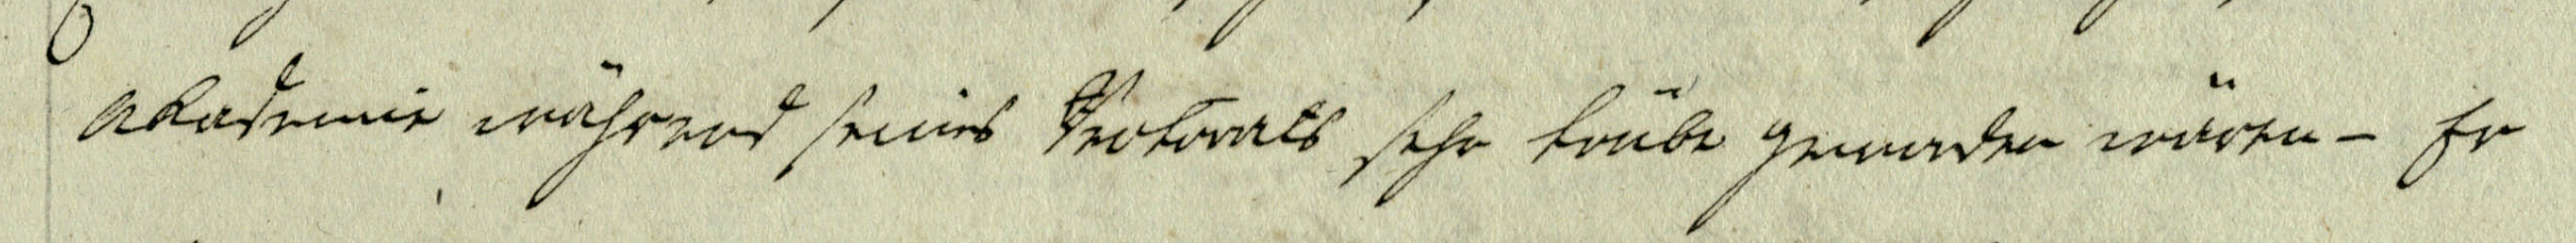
Akademie während seines Rectorats sehr trübe geworden wären. Er
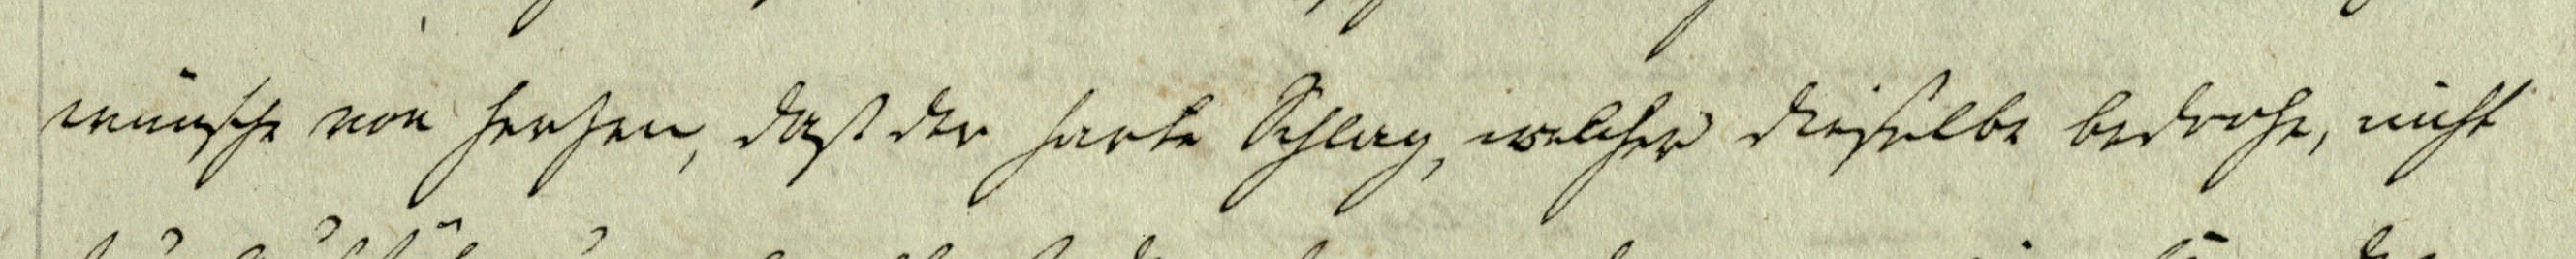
wünsche von Herzen, daß der harte Schlag, welcher dieselbe bedrohe, nicht
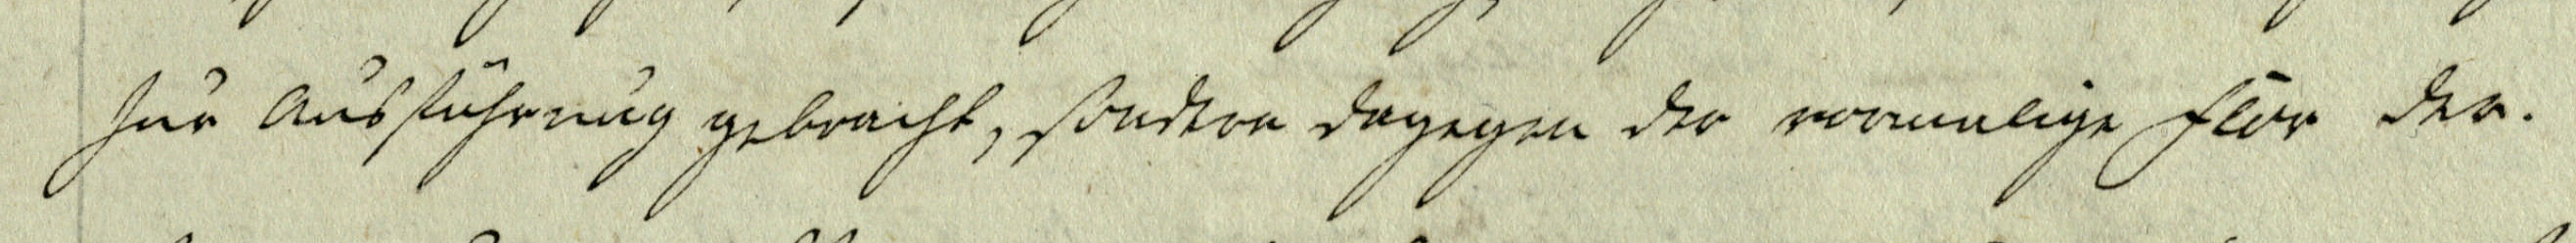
zur Ausführung gebracht, sondern dagegen der vormalige Flor der¬
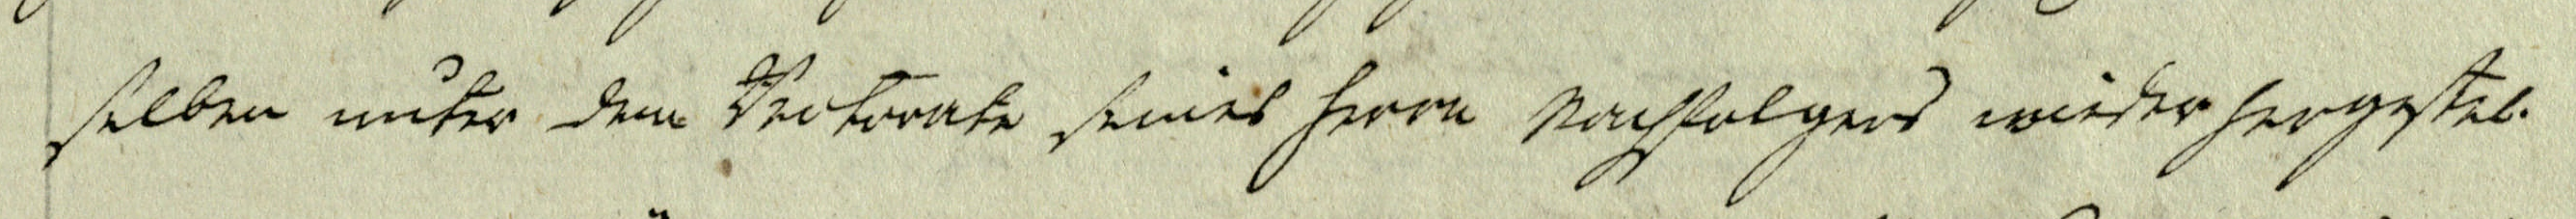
selben unter dem Rectorate seines Herrn Nachfolgers wieder hergestel¬
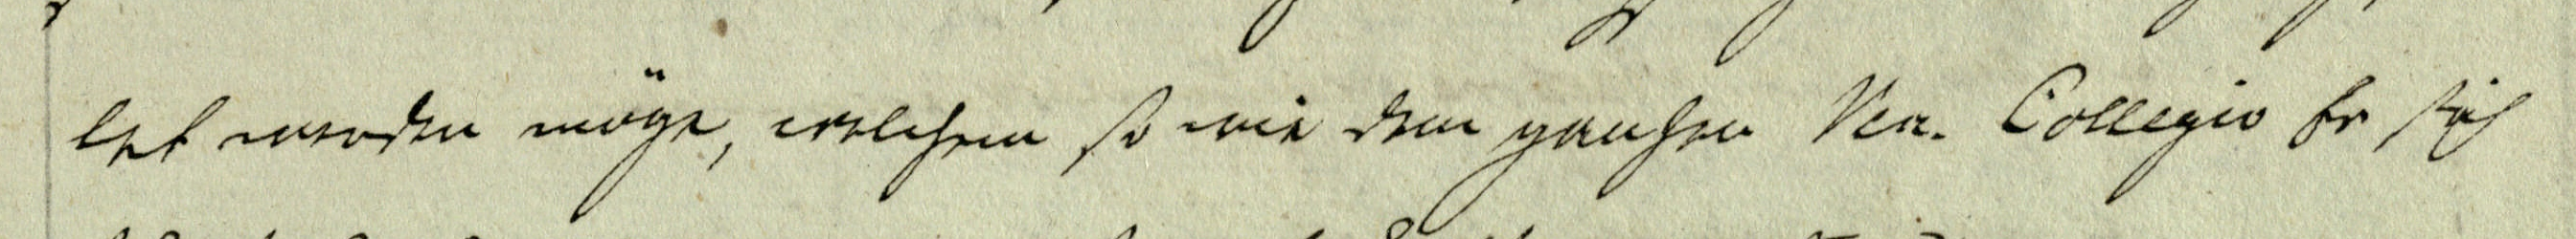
let werden möge, welchem so wie dem ganzen Ven. Collegio Er sich
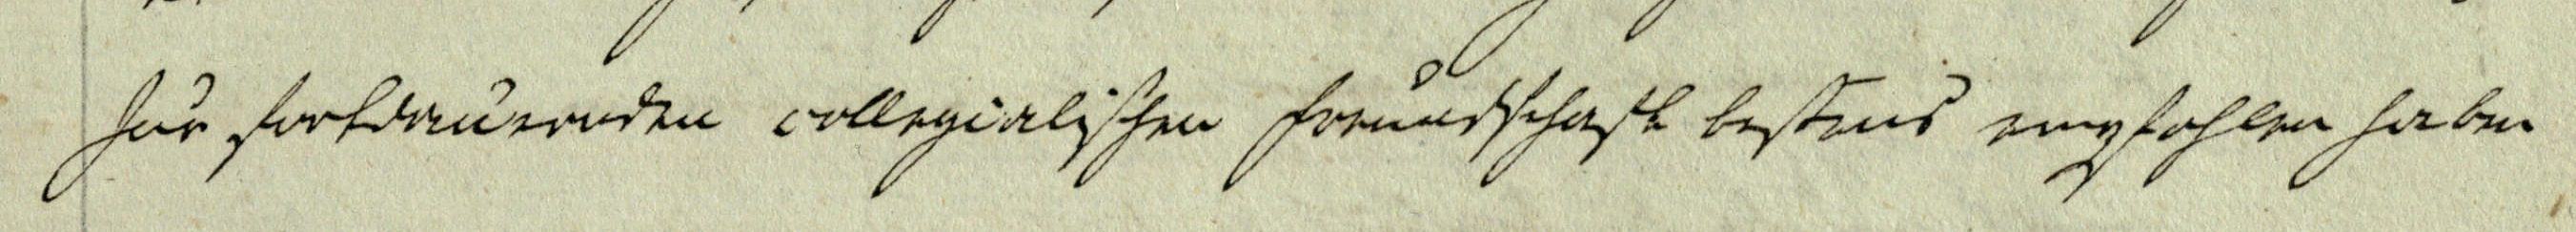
zur fortdauernden collegialischen Freundschaft bestens empfohlen haben
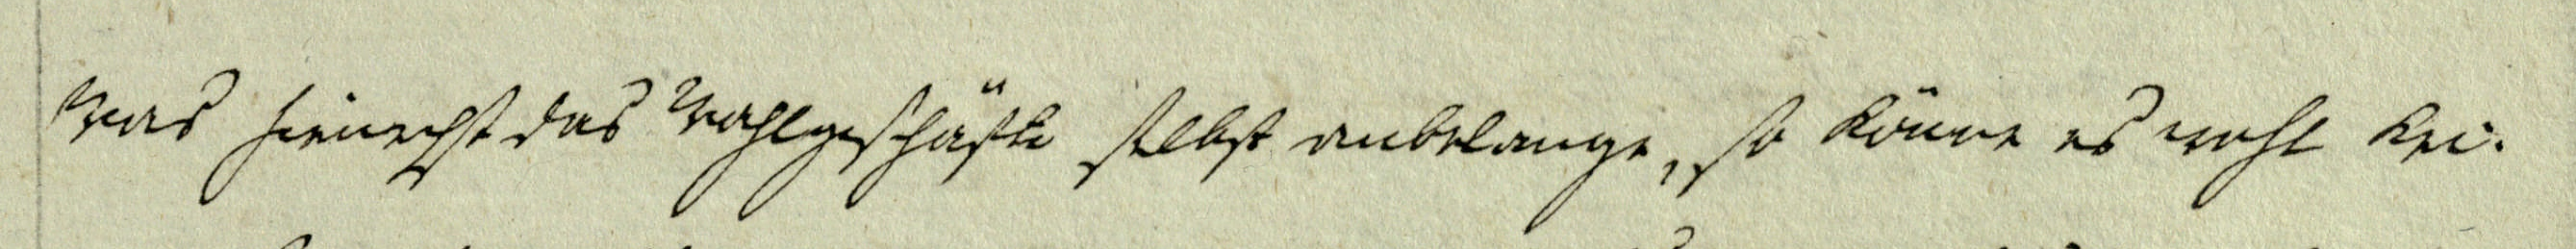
Was hienechst das Wahlgeschäfte selbst anbelange, so könne es wohl kei¬
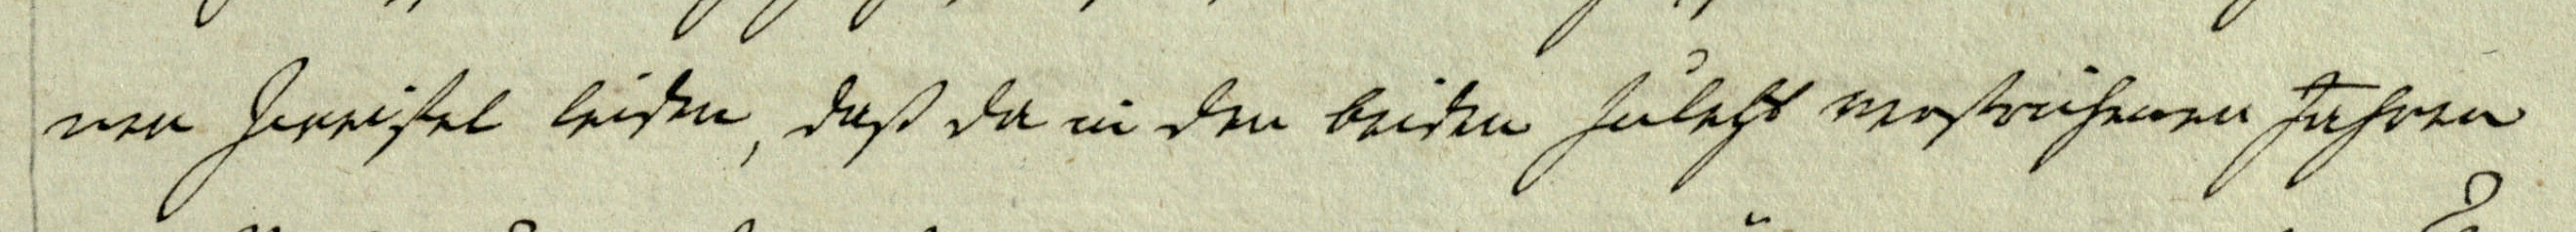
nen Zweifel leiden, daß da in den beiden zuletzt verstrichenen Jahren
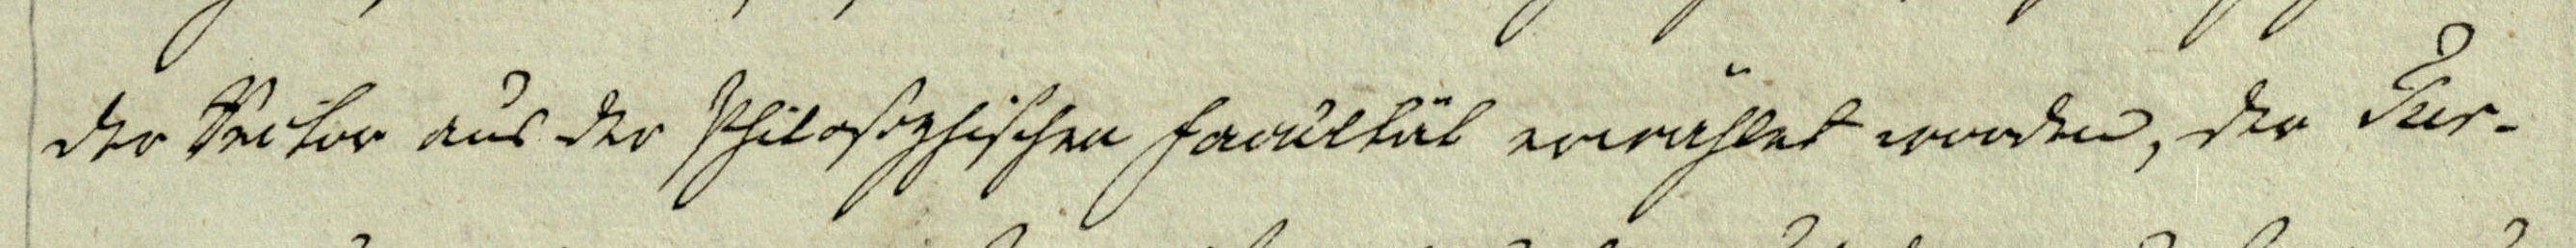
der Rector aus der Philosophischen Facultät erwählet worden, der Tur¬
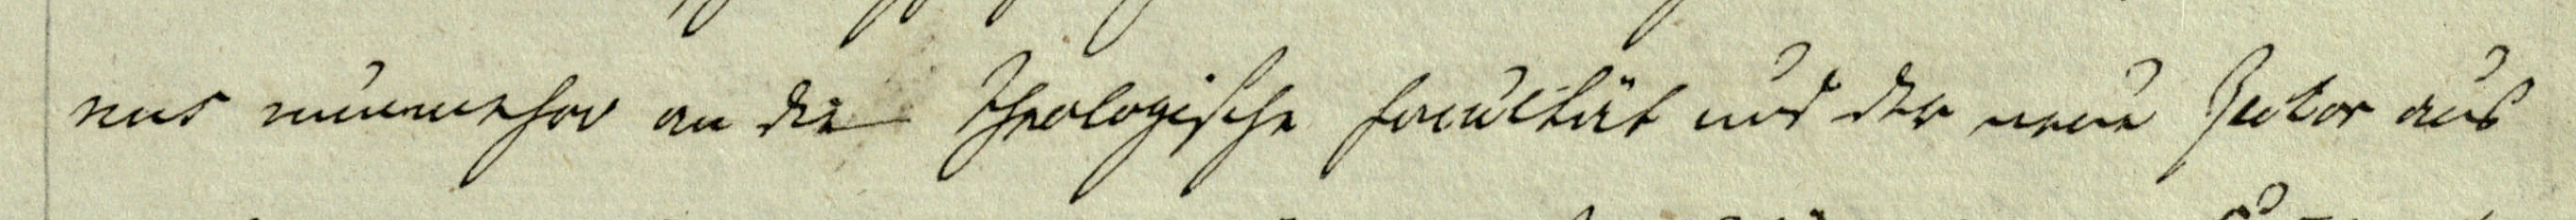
nus nunmehro an die Theologische Facultät und der neue Rector aus
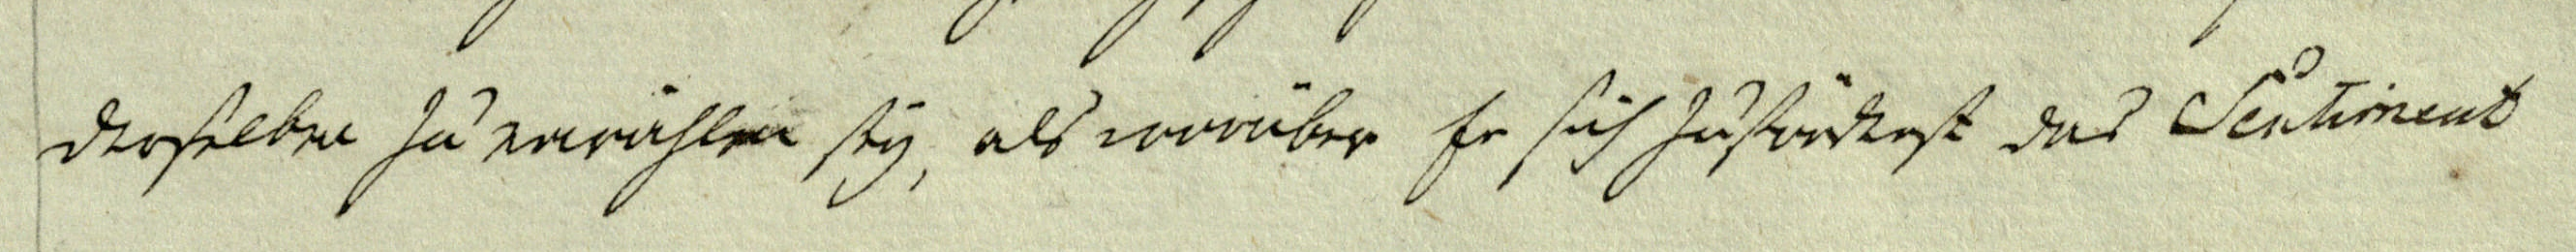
derselben zu erwählen seÿ, als worüber Er sich zuförderst das Sentiment
